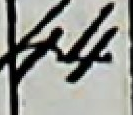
44
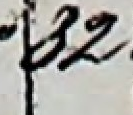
32
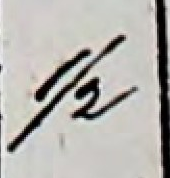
1/2
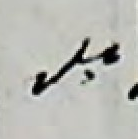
Do
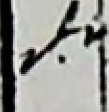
Do
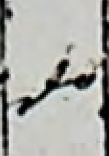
Do
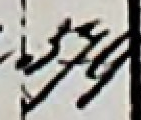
379
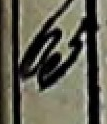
65
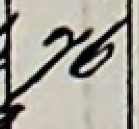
76
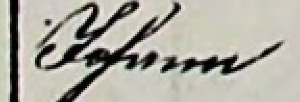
Johann
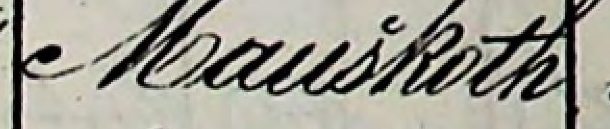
Mauskoth
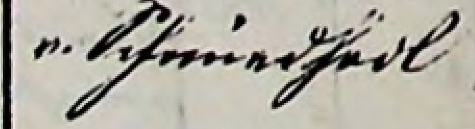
v. Schmiedhedl
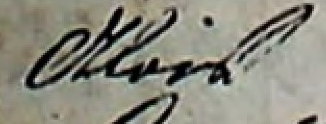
Alois
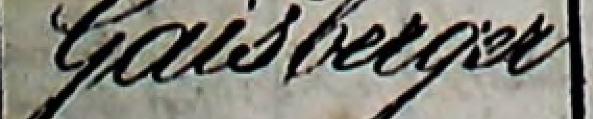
Gaisberger
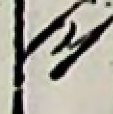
61
